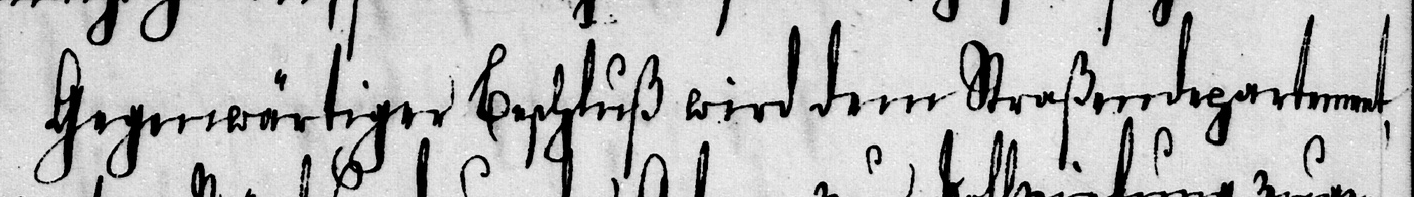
Gegenwärtiger Beschluß wird dem Straßendepartem¬
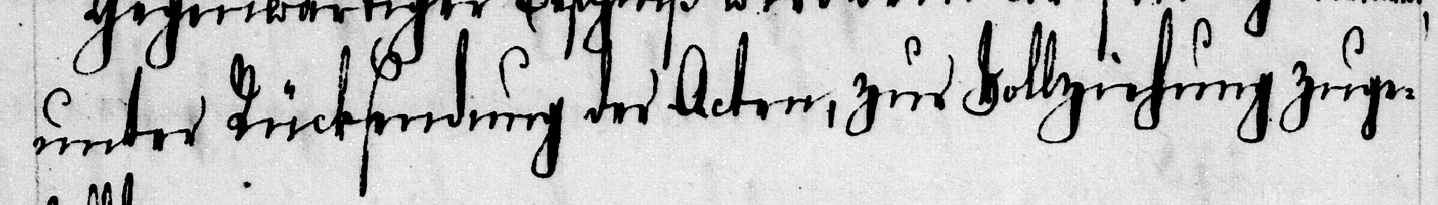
unter Rücksendung der Acten, zur Vollziehung zuges¬
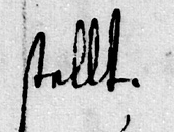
tellt.
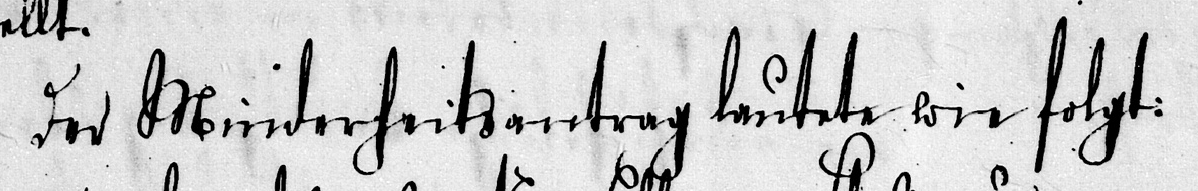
Der Minderheitsantrag lautet wie folgt:
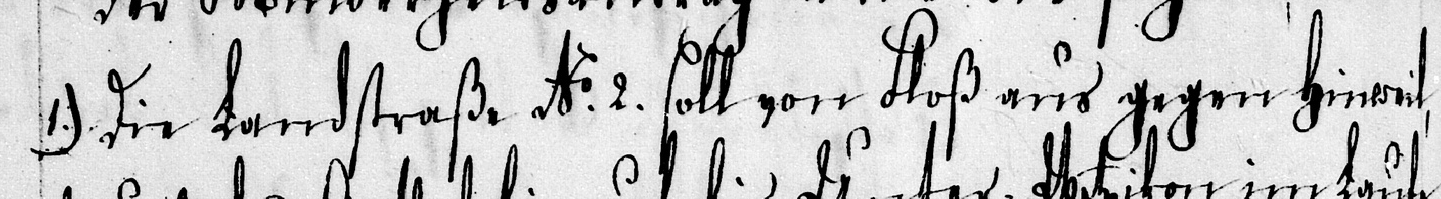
1.) Die Landstraße No. 2 soll von Floß aus gegen Hin¬
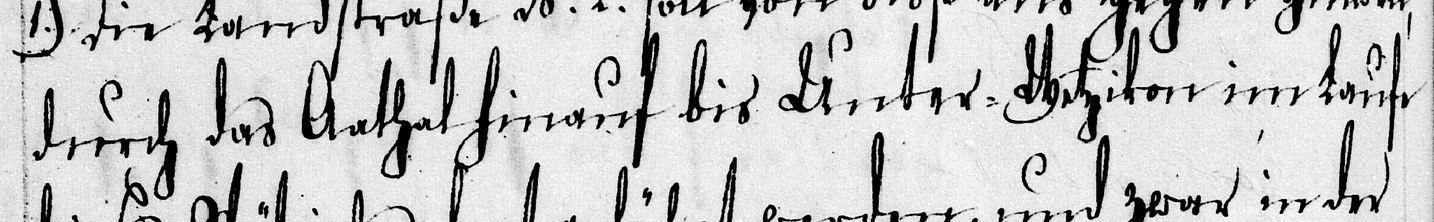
durch das Aathal hinauf bis Unter-Wetzikon im Laufe
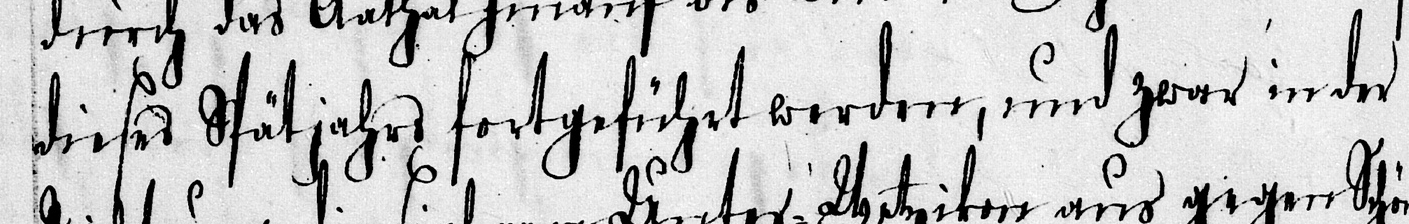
dieses Spätjahrs fortgeführt werden, und zwar in der
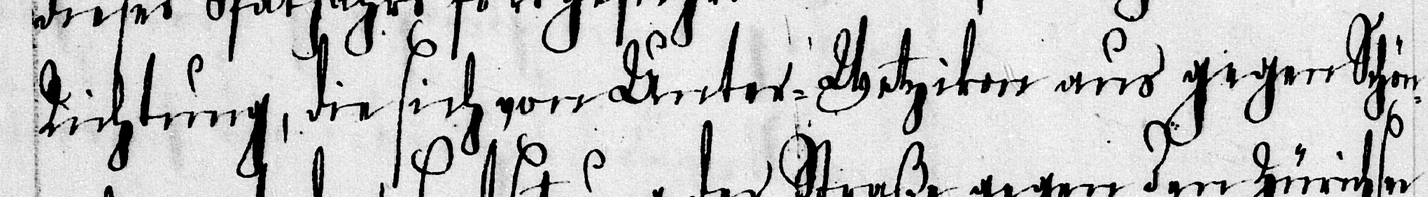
Richtung, die sich von Unter-Wetzikon aus gegen Schö¬
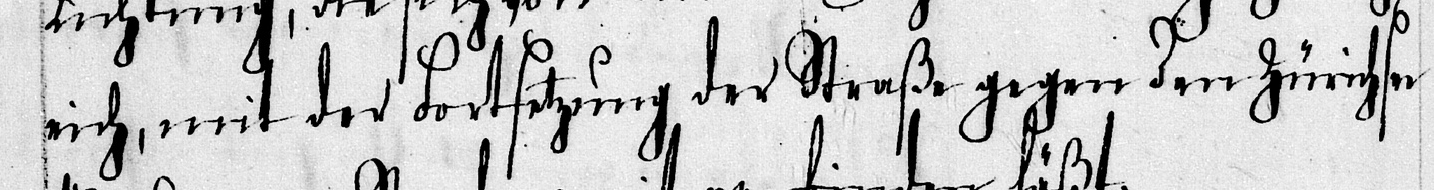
neich, mit der Fortsetzung der Straße gegen den Zürichse¬
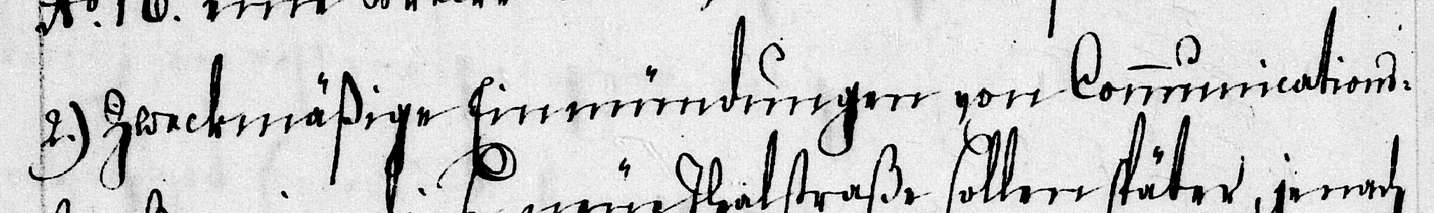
2.) Zweckmäßige Einmündungen von Communications¬
